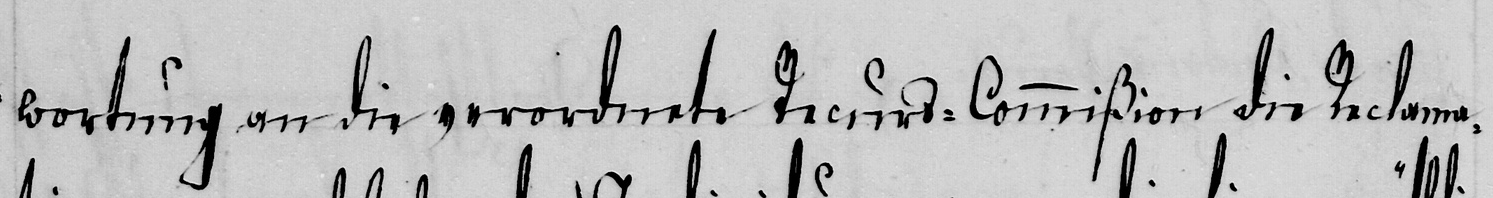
wortung an die verordnete Recurs-Commißion die Reclama¬
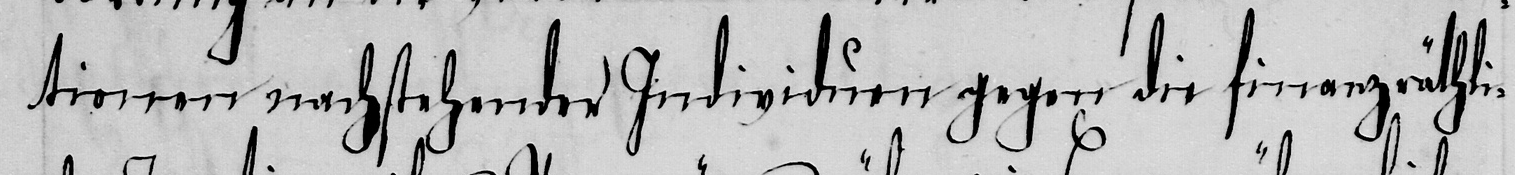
tionen nachstehender Individuen gegen die finanzräthli¬
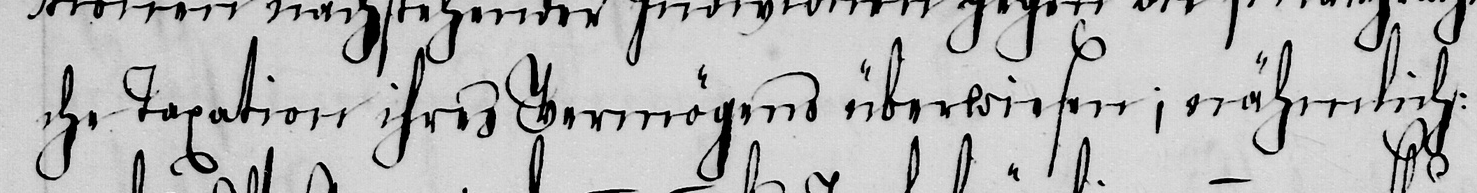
che Taxation ihres Vermögens überwiesen; nähmlich:
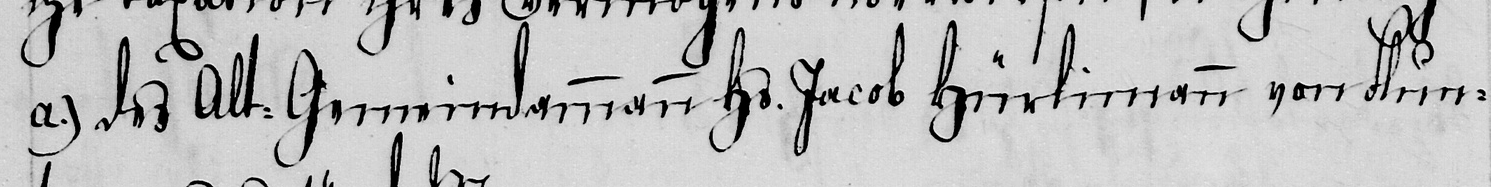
a.) des Alt-Gemeindammann Hs. Jacob Hürlimann von Flun¬
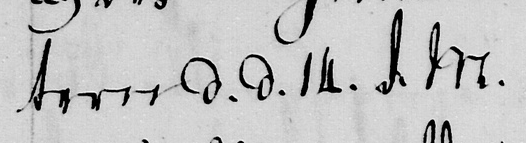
tern d. d. 14. d. M.
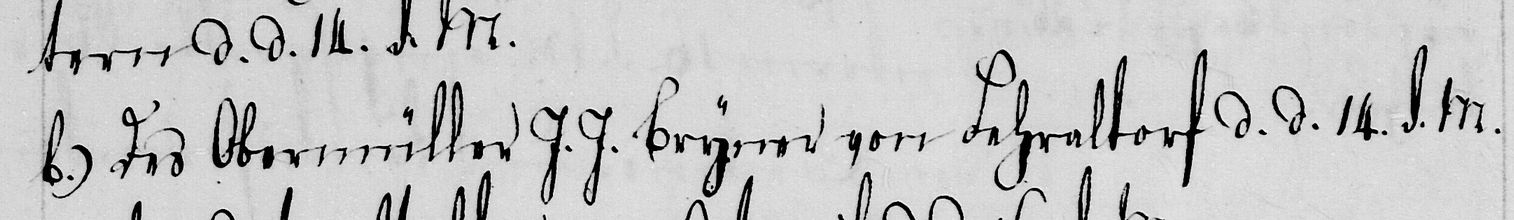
b.) Des Obermüller J. J. Bryner von Fehraltorf d. d. 14. d. M.
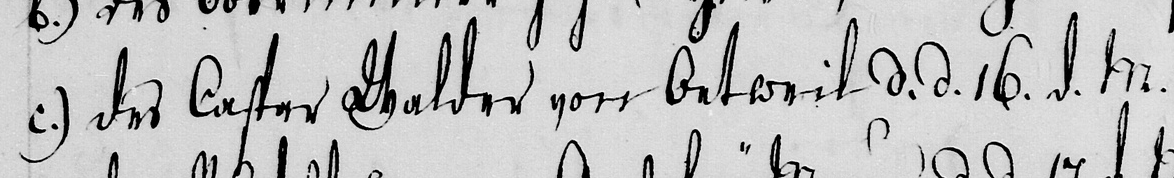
c.) des Caspar Walder von Oetweil d. d. 16. d. M.
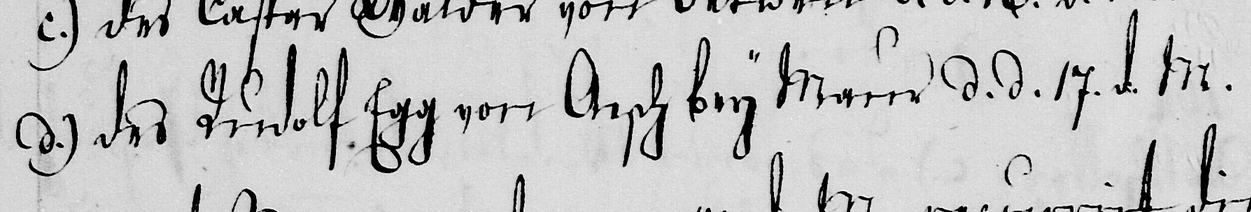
d.) des Rudolf Egg von Aesch bey Maur d. d. 17. d. M.
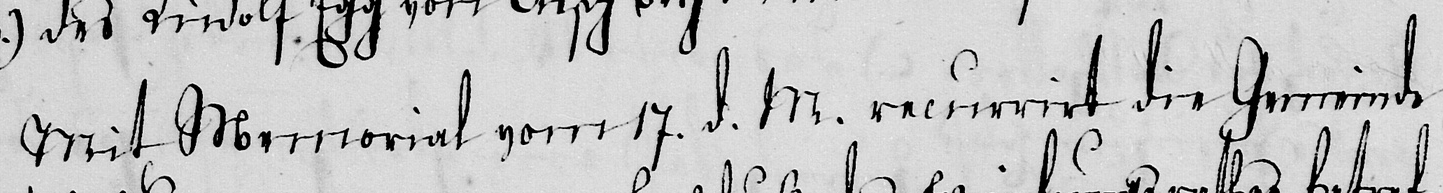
Mit Memorial vom 17. d. M. recurrirt die Gemeinde
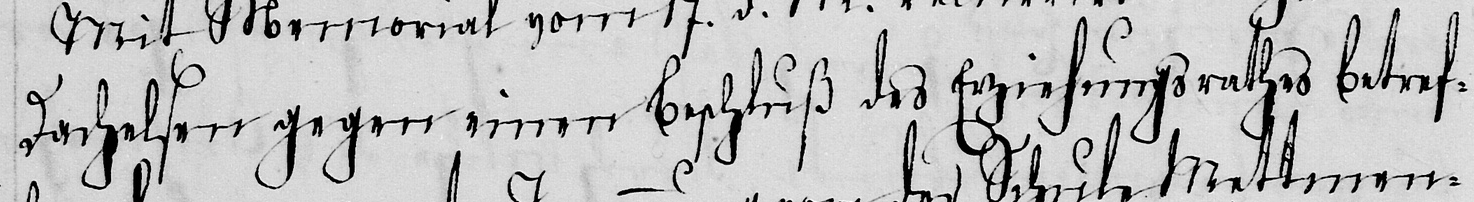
Dachelsen gegen einen Beschluß des Erziehungsrathes betref¬
